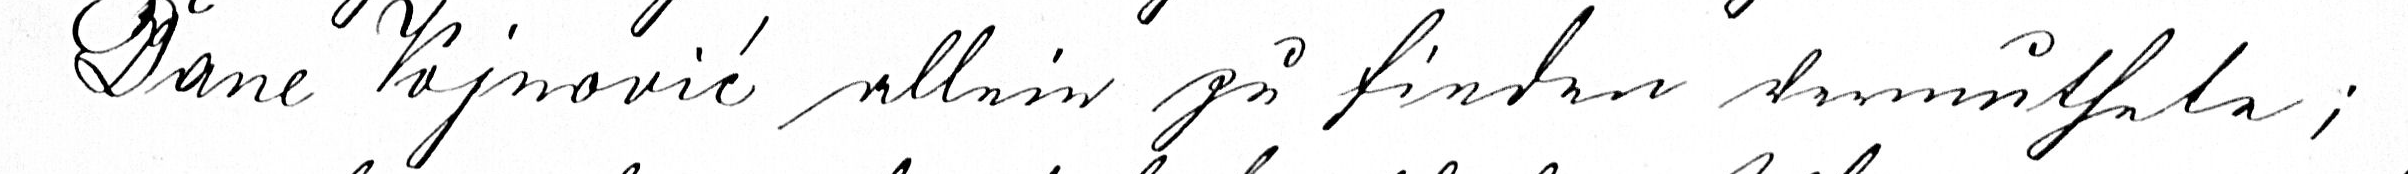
Dane Vojnović allein zu finden vermuthete;
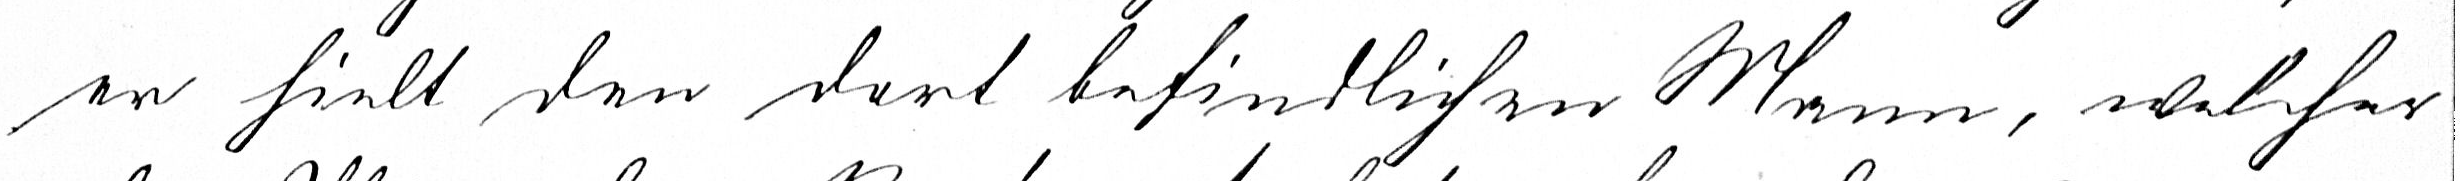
er hielt den dert befindlichen Mann, welcher
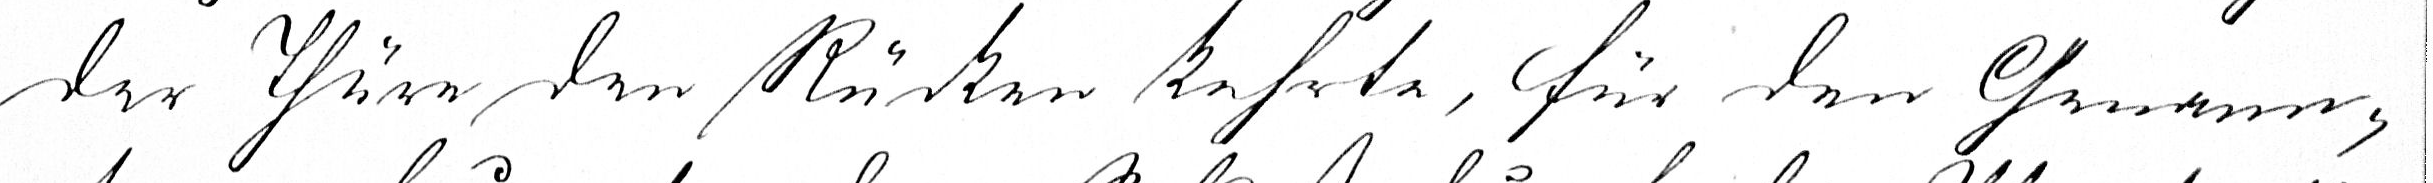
der Thüre den Rücken kehrte, für den Genann¬
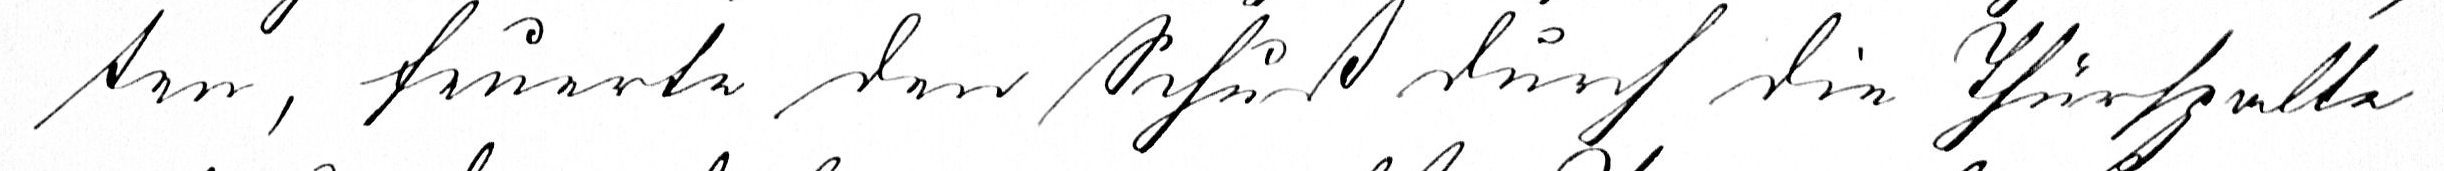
ten, feuerte den Schuß durch die Thürspalte
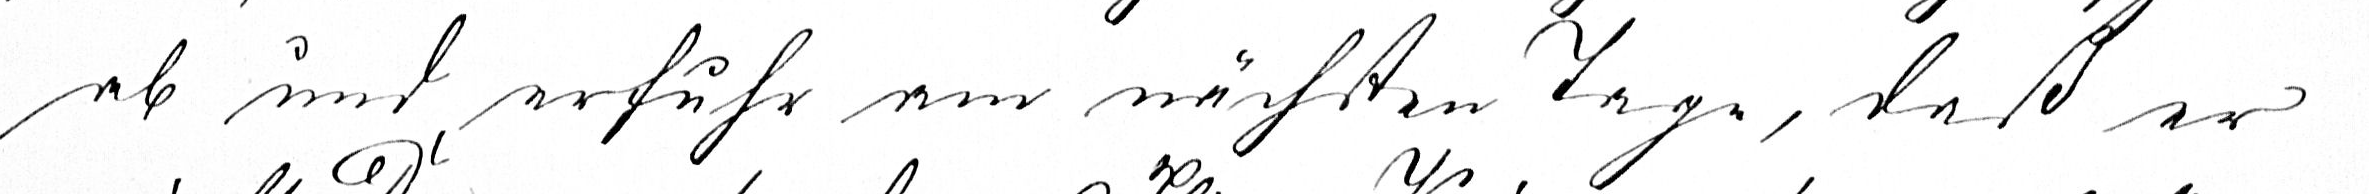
ab und erfuhr am nächsten Tage, daß er
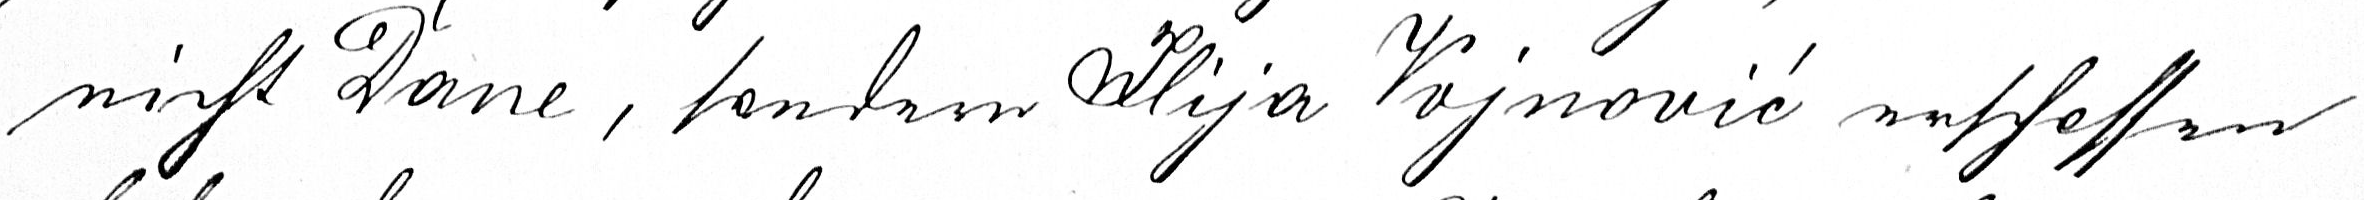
nicht Dane, sondern Ilija Vojnović erschossen
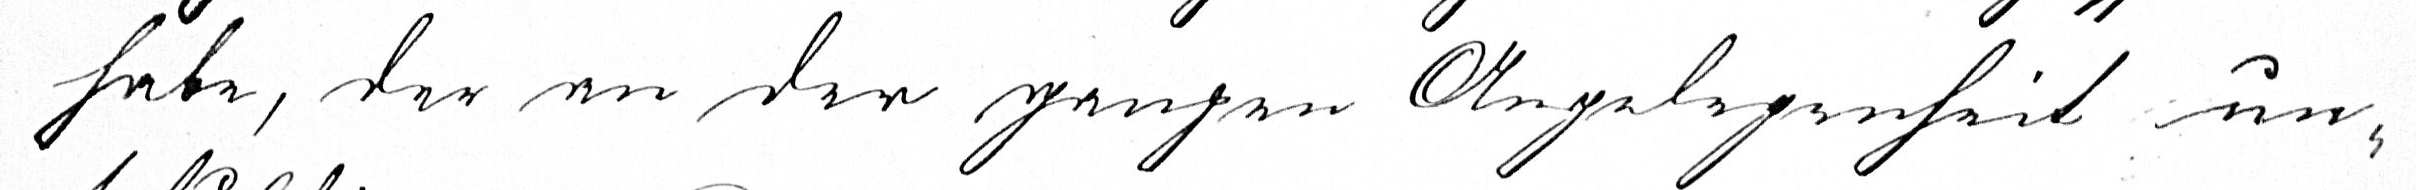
habe, der en der ganzen Angelegenheit un¬
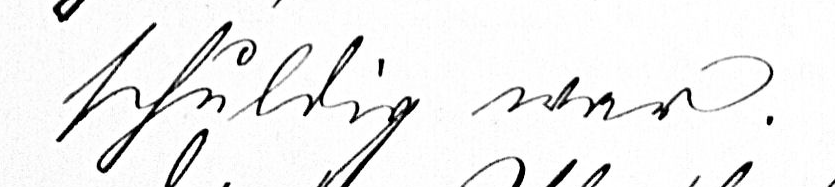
schuldig war.
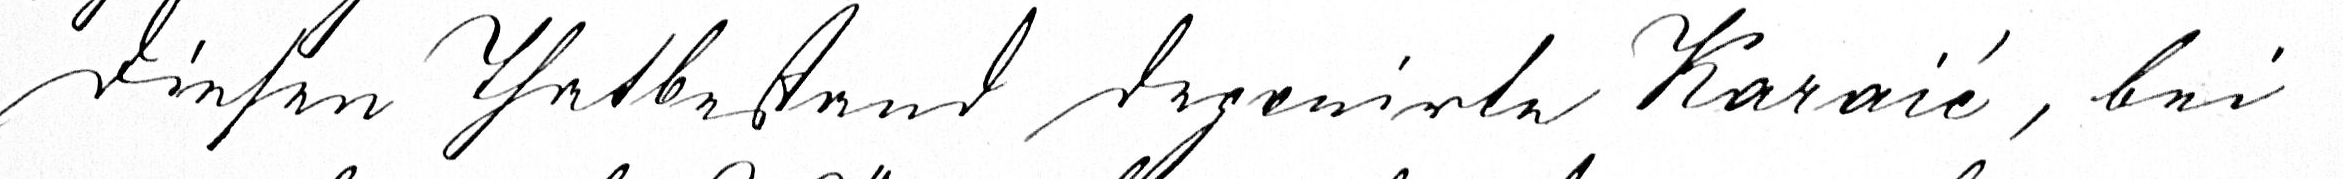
Diesen Thatbestand depenirte Karaić, bei
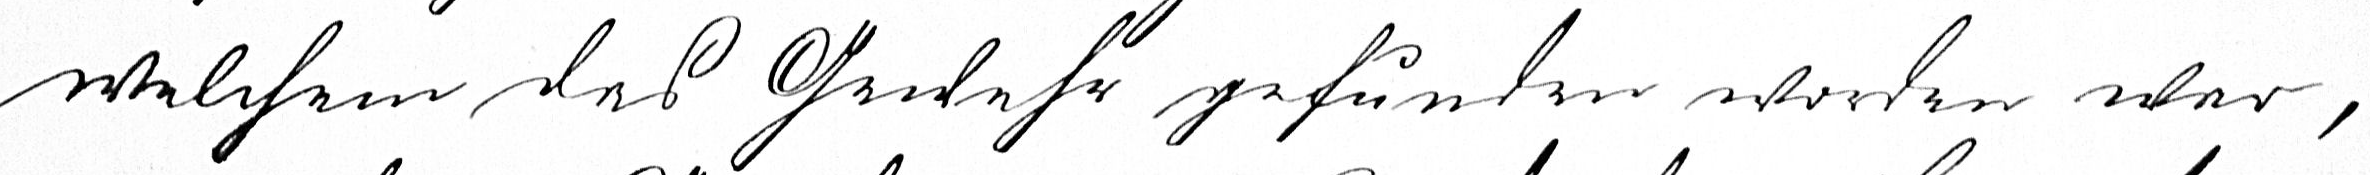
welchen des Gewehr gefunden worden war,
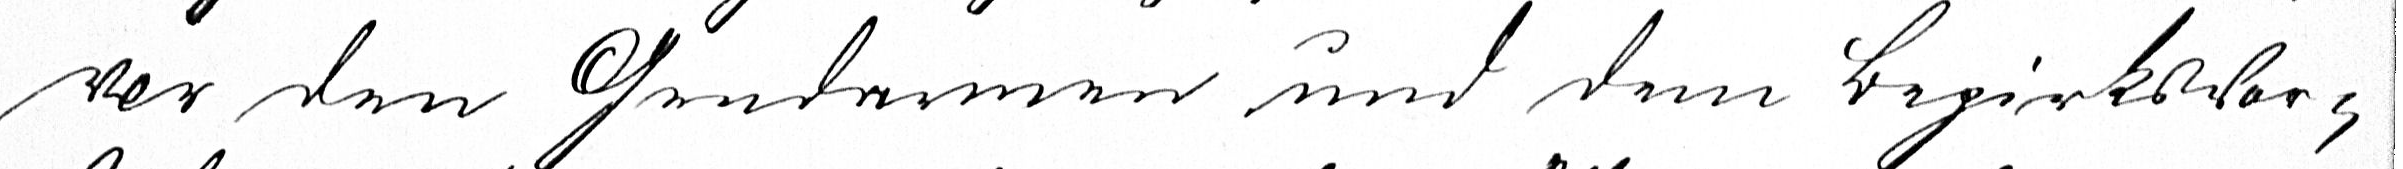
vor den Gendarmen und dem Bezirksvor¬
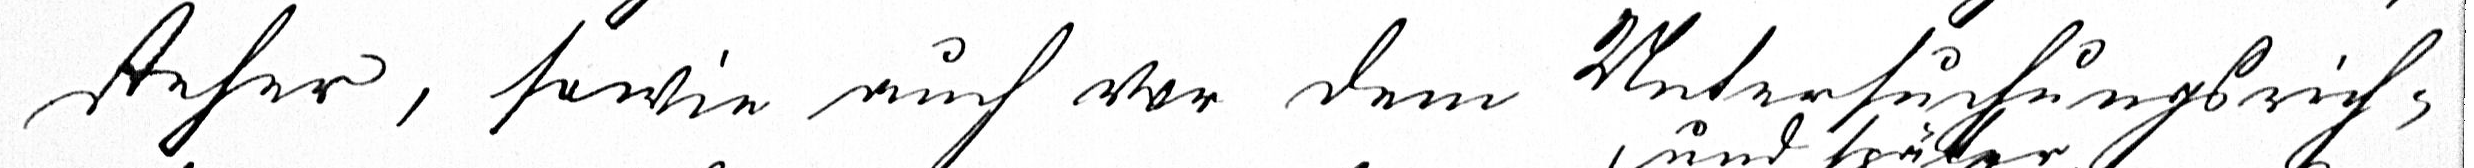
steher, sowie auch vor dem Untersuchungsrich¬
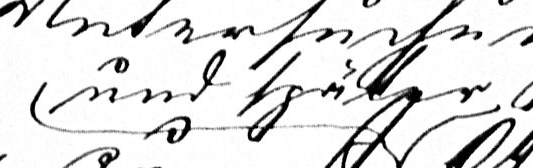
und später
